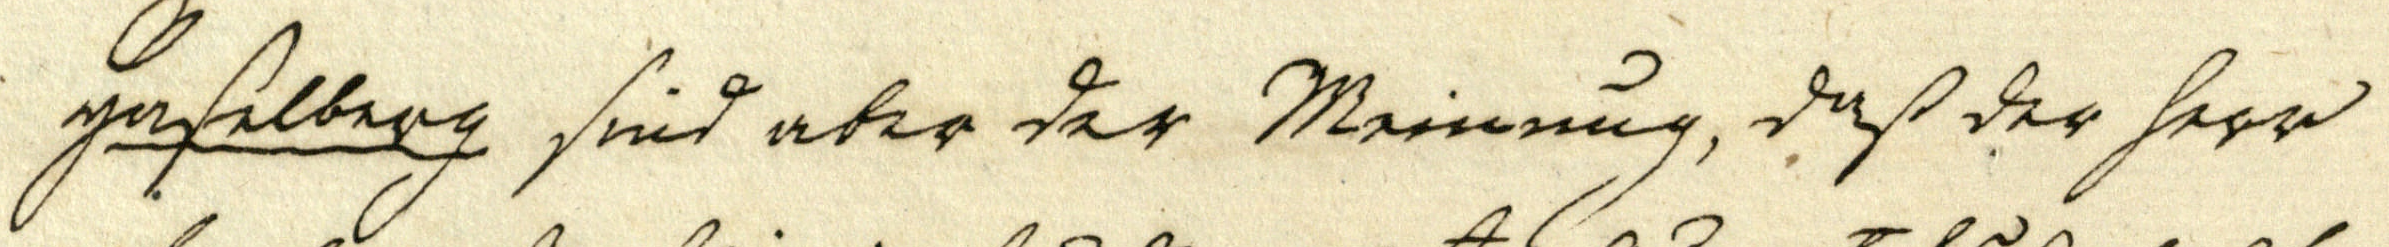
Haselberg sind aber der Meinung, daß der Herr
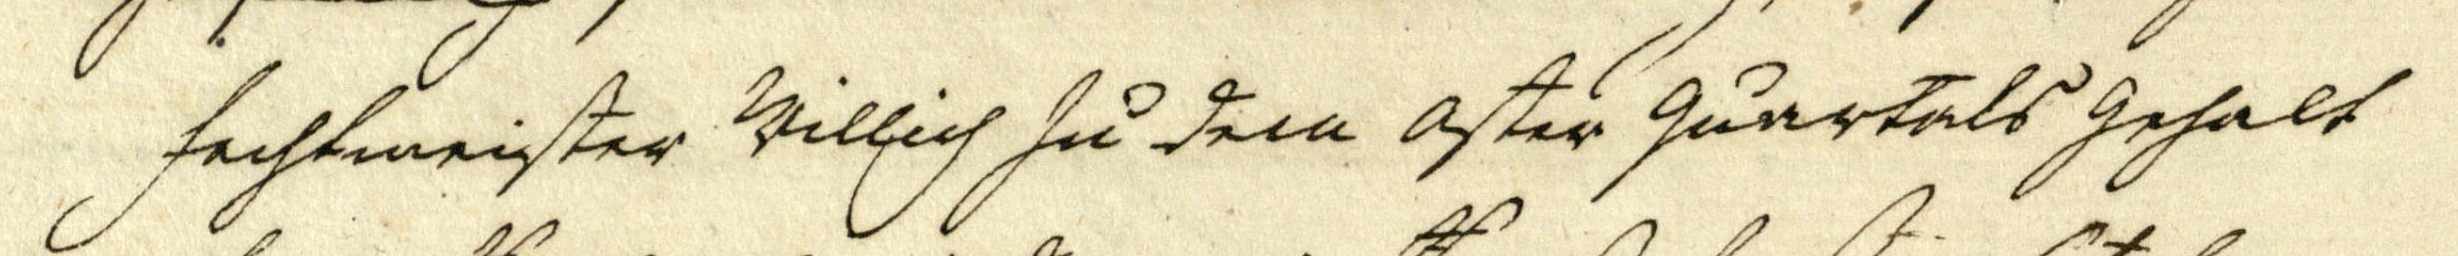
Fechtmeister Willich zu dem Oster Quartals Gehhalt
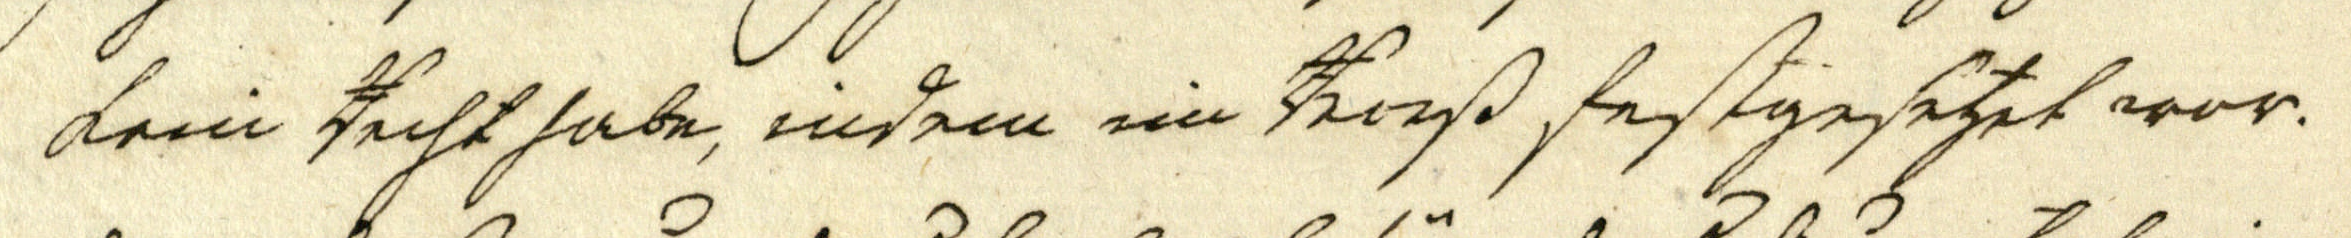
kein Recht habe, indem im Receß festgesetzet wor¬
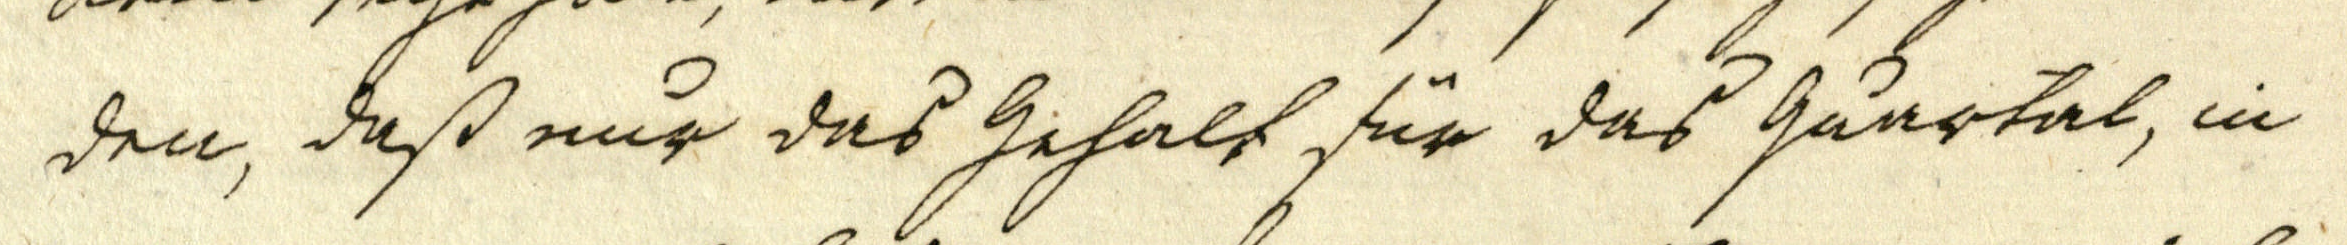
den, daß nur das Gehalt für das Quartal, in
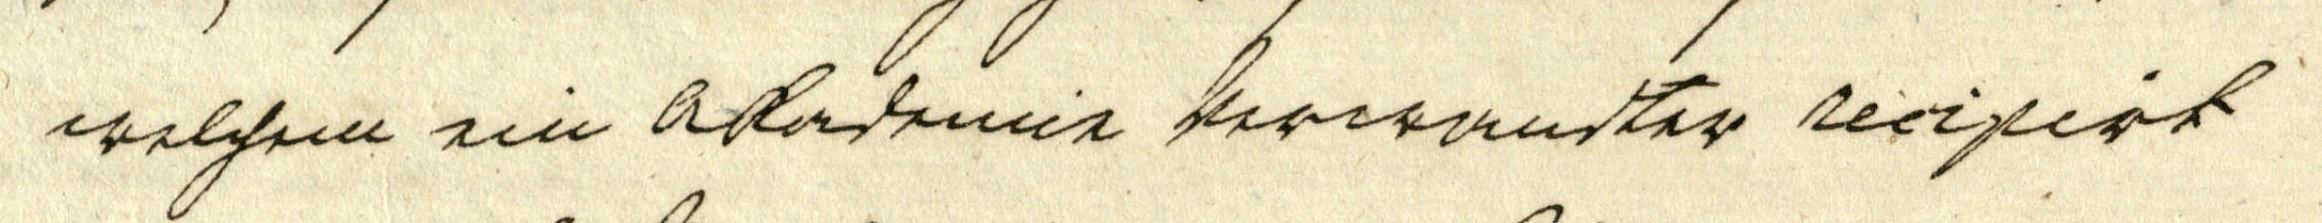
welchem ein Akademie Verwandter recipirt
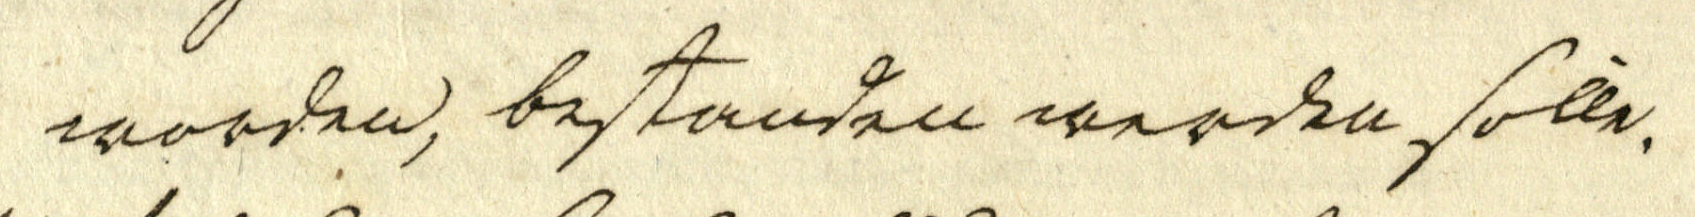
worden, bestanden werden solle.
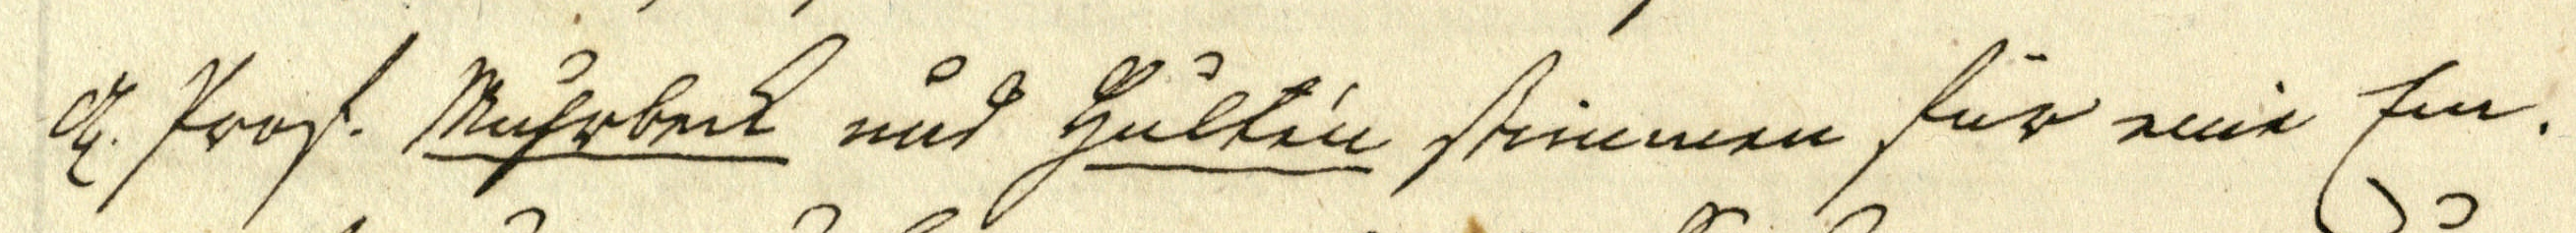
dh. Prof. Muhrbeck und Hultèn stimmen für eine Em¬
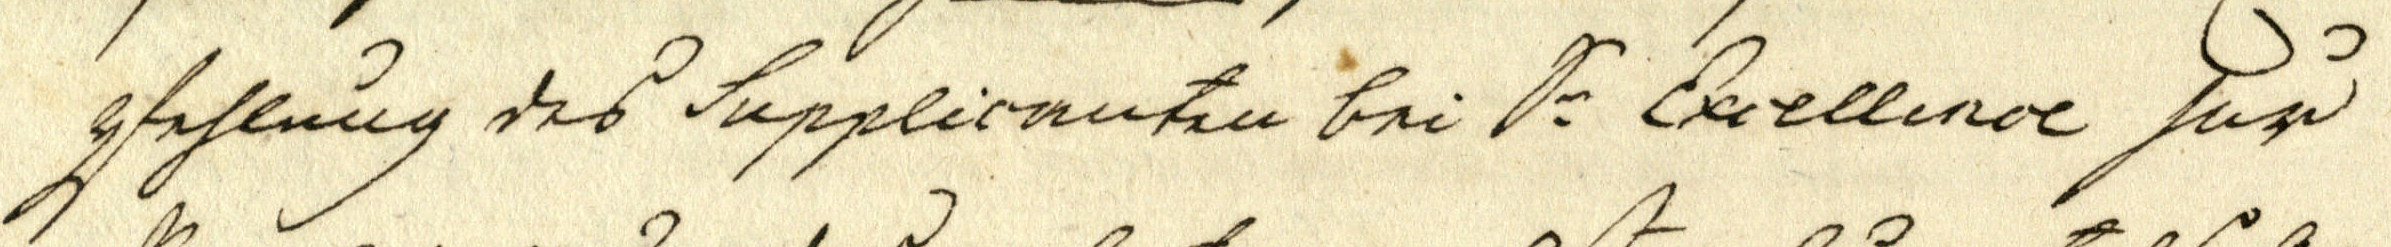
pfehlung des Supplicanten bei Sr. Excellence für
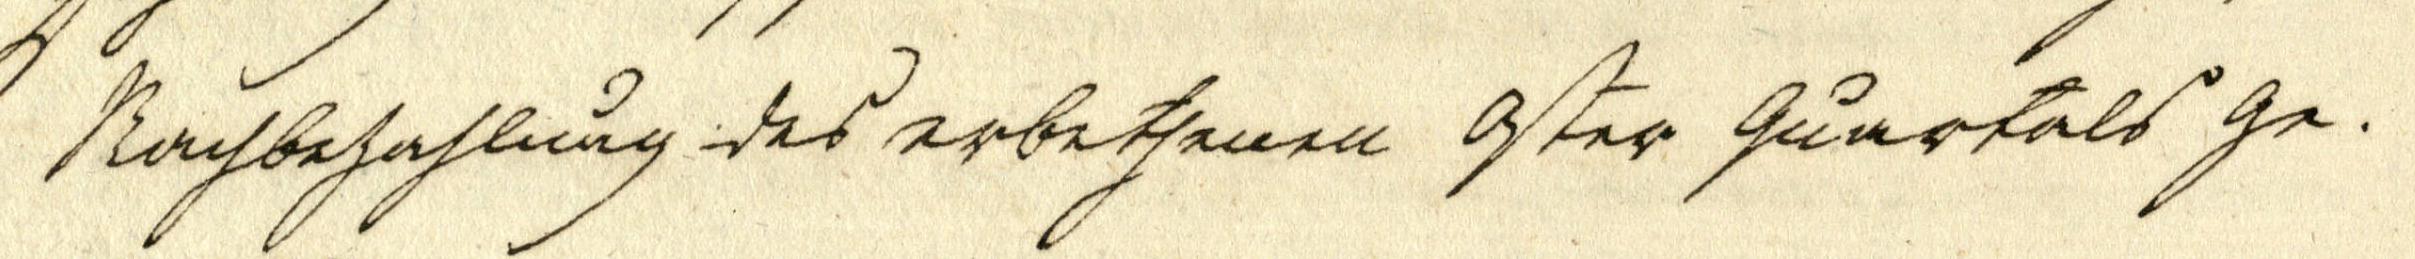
Nachbezahlung des erbethenen Oster Quartals Ge¬
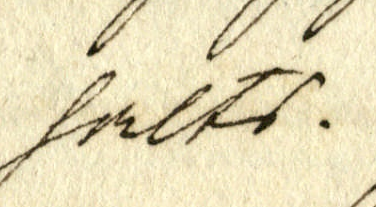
halts.
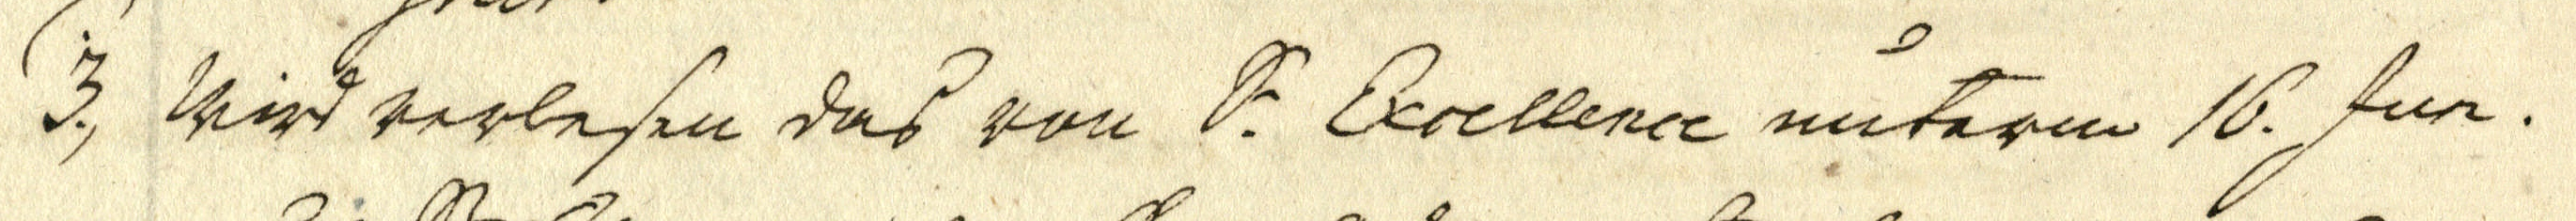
3., Wird verlesen das von Sr. Excellence unterm 16. Jun.
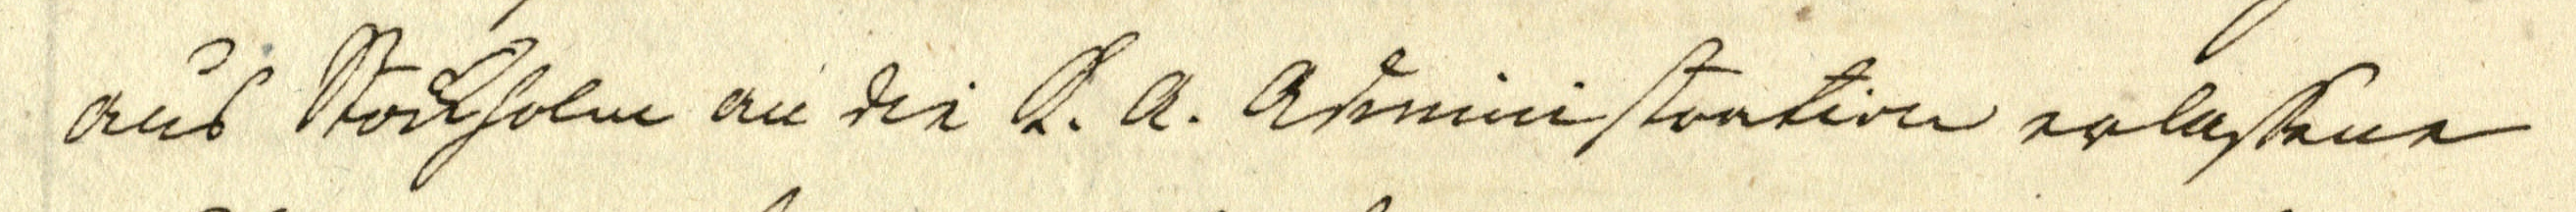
aus Stockholm an die K. A. Administration erlassene
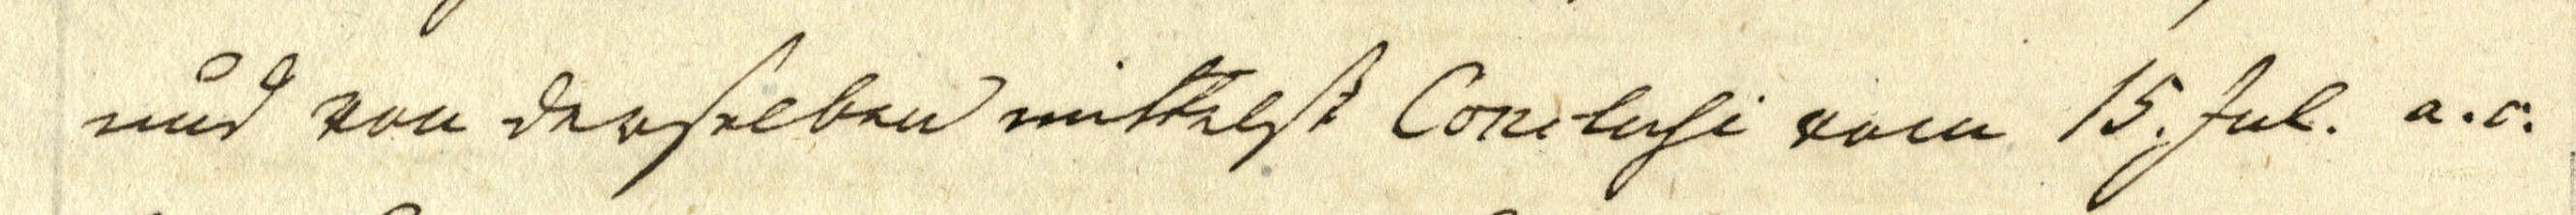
und zu derselben mittelst Conclusi vom 15. Jul. a. c.
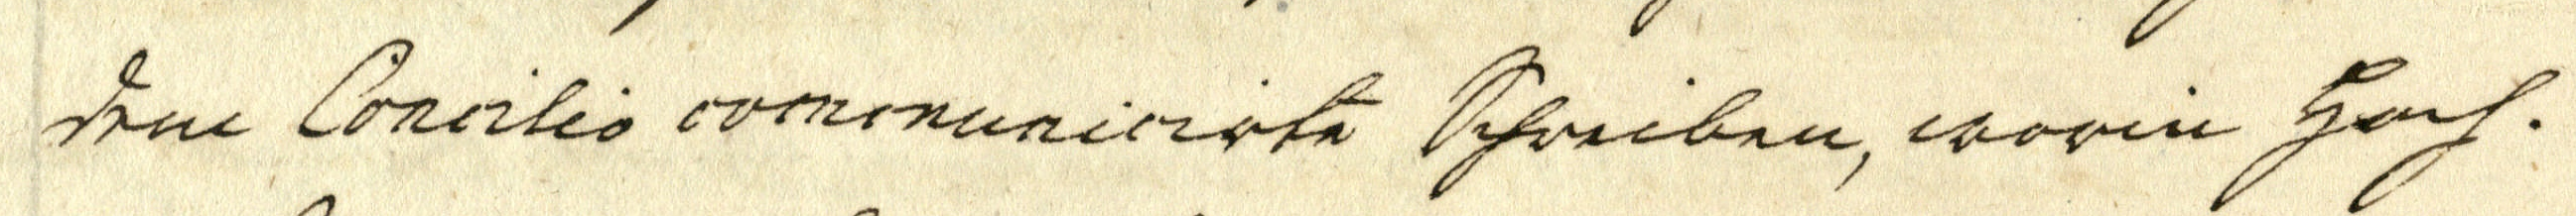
dem Concilio communicirte Schreiben, worin Hoch¬
